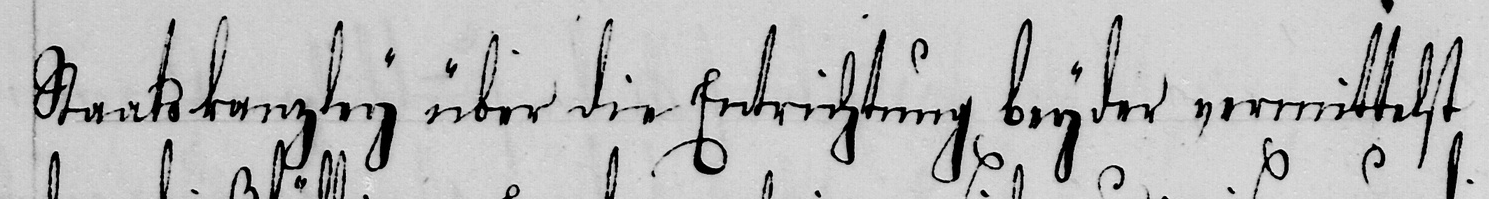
Staatskanzley über die Entrichtung bey der vermittelst
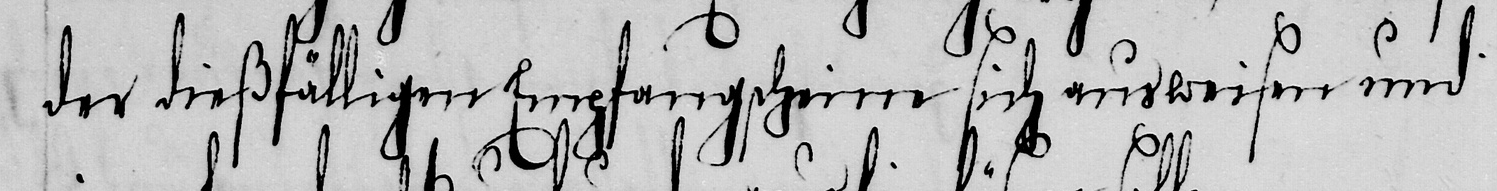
der dießfälligen Empfangscheine sich ausweisen und
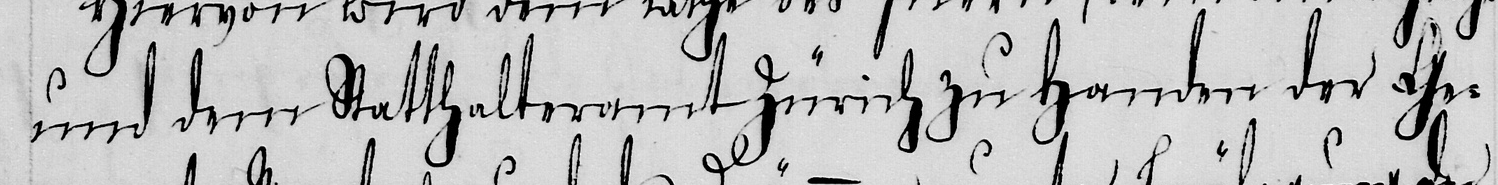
und dem Statthalteramt Zürich zu Handen der Ge¬
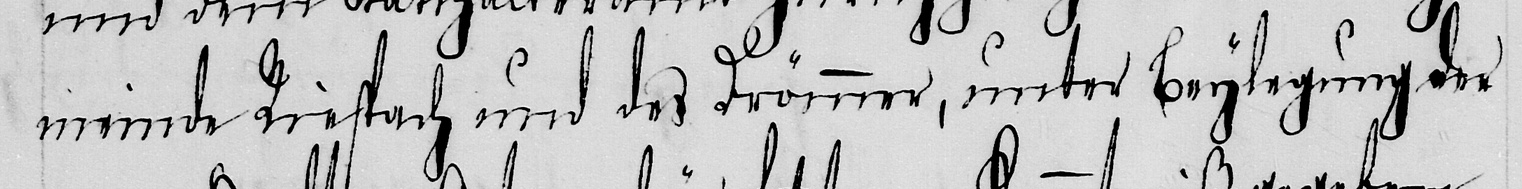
meinde Riespach und des Drömmer, unter Beylegung der
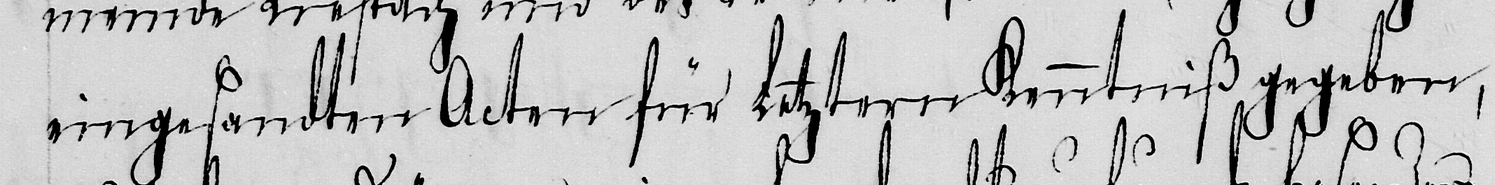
eingesandten Acten für Letztern Kenntniß gegeben,
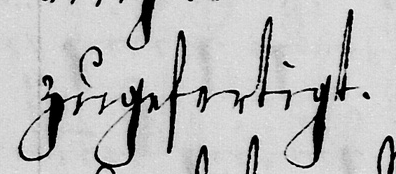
zugefertigt.
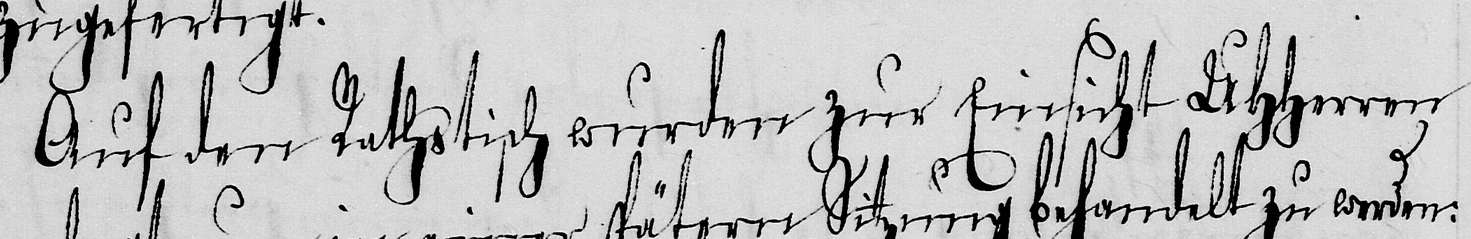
Auf den Rathstisch wurden zur Einsicht UHHerren
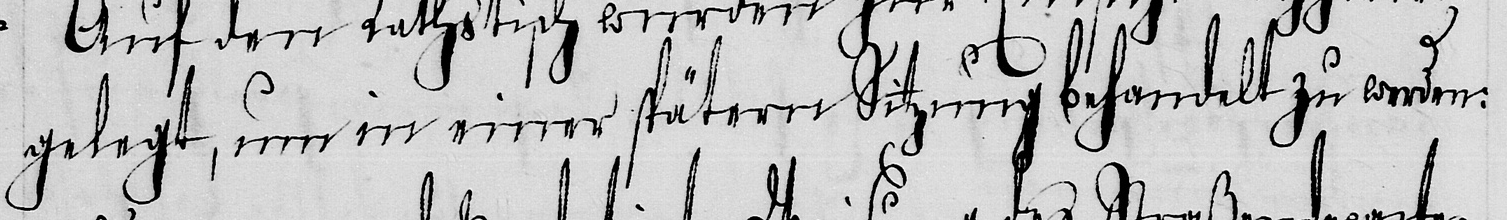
gelegt, um in einer spätern Sitzung behandelt zu werden:
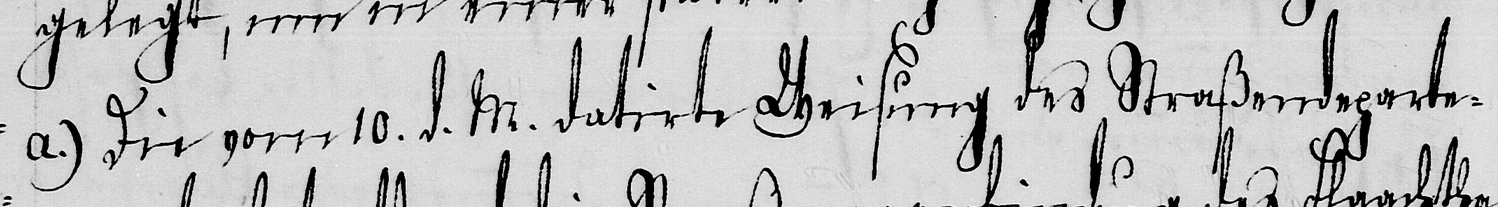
a.) Die vom 10. d. M. datirte Weisung des Straßendeparte¬
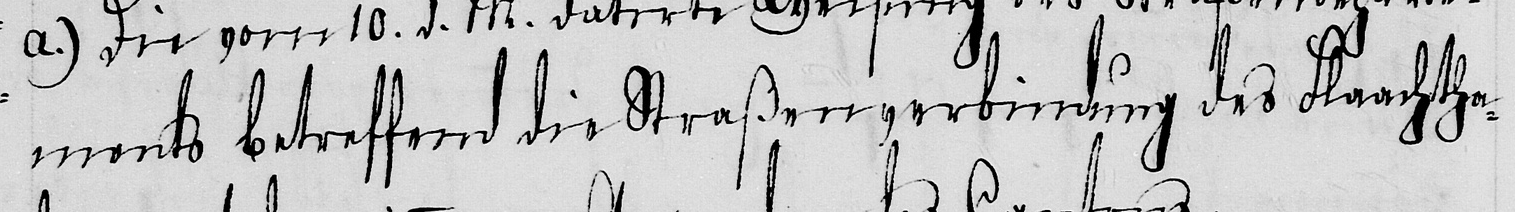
ments betreffend die Straßenverbindung des Flaachth¬
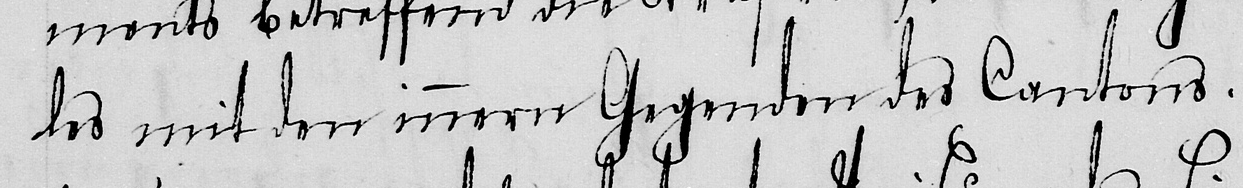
ales mit den innern Gegenden des Cantons.
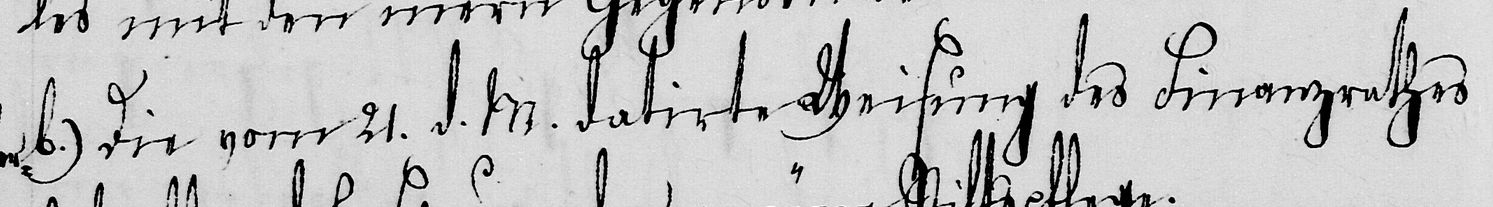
b.) Die vom 21. d. M. datirte Weisung des Finanzrathes
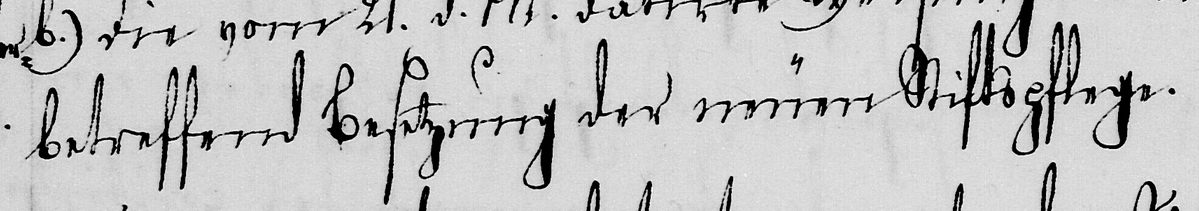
betreffend Besetzung der neuen Stiftspflege.
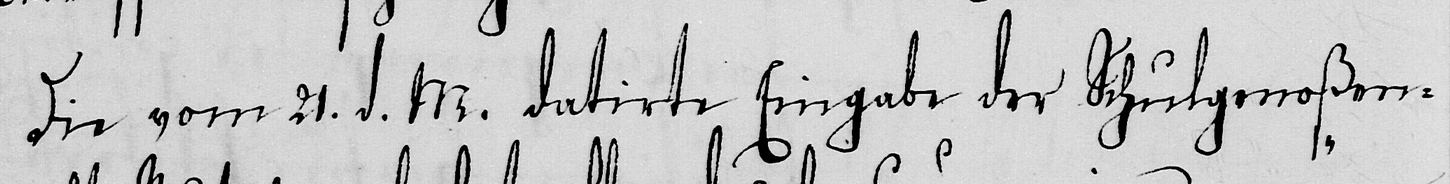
Die vom 21. d. M. datirte Eingabe der Schulgenoßen¬
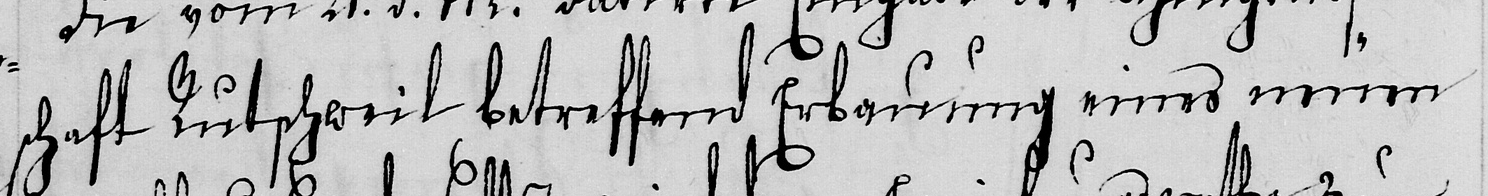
schaft Rutschweil betreffend Erbauung eines neuen
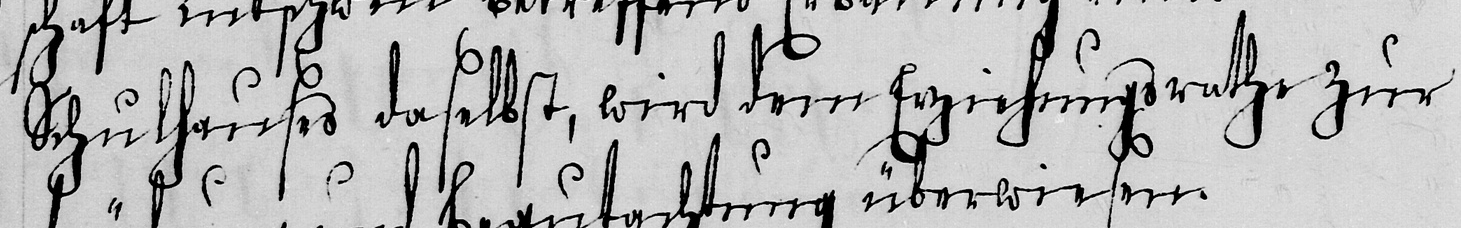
Schulhauses daselbst, wird dem Erziehungsrathe zur
